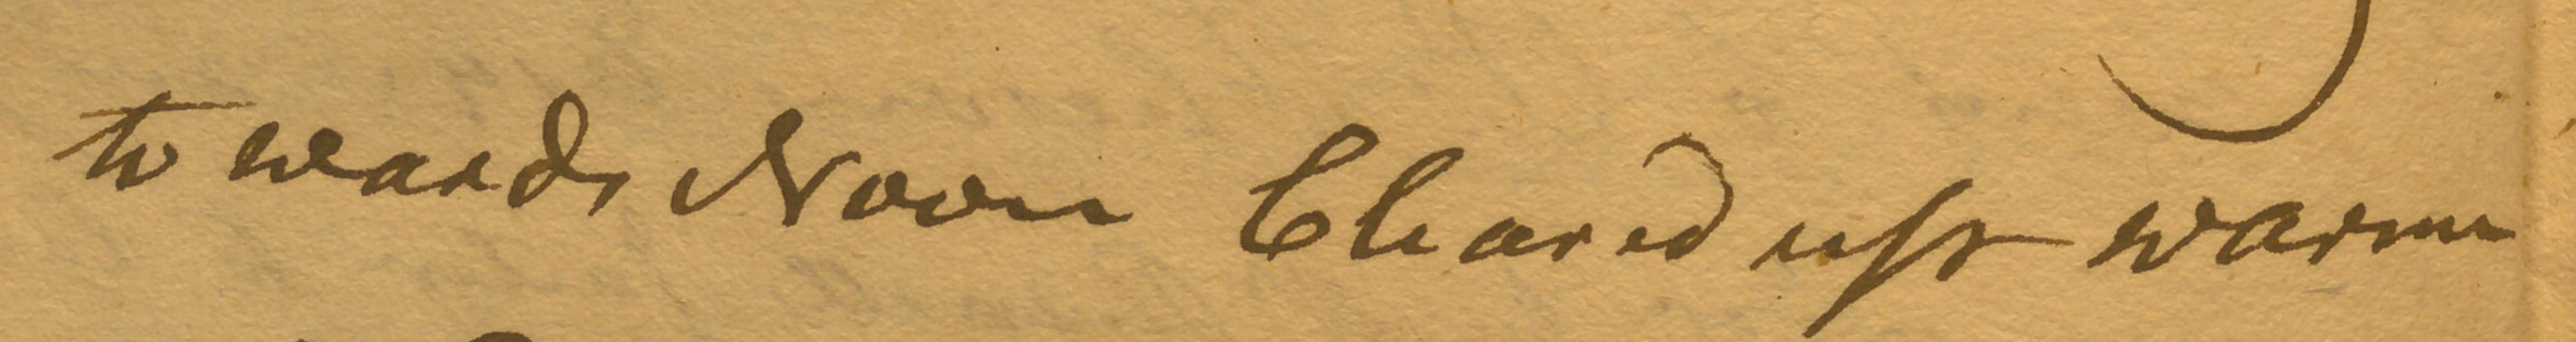towards Nown Cleared up warm
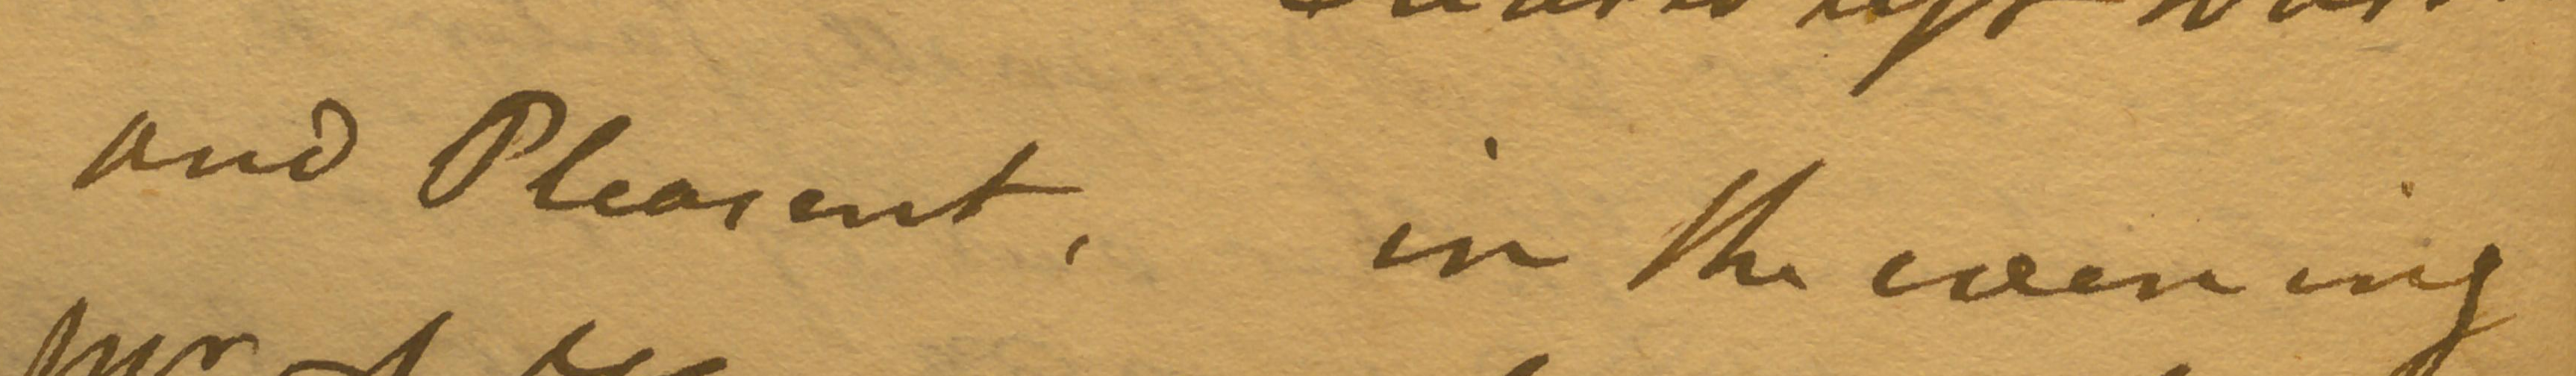and Pleasent, in the evening
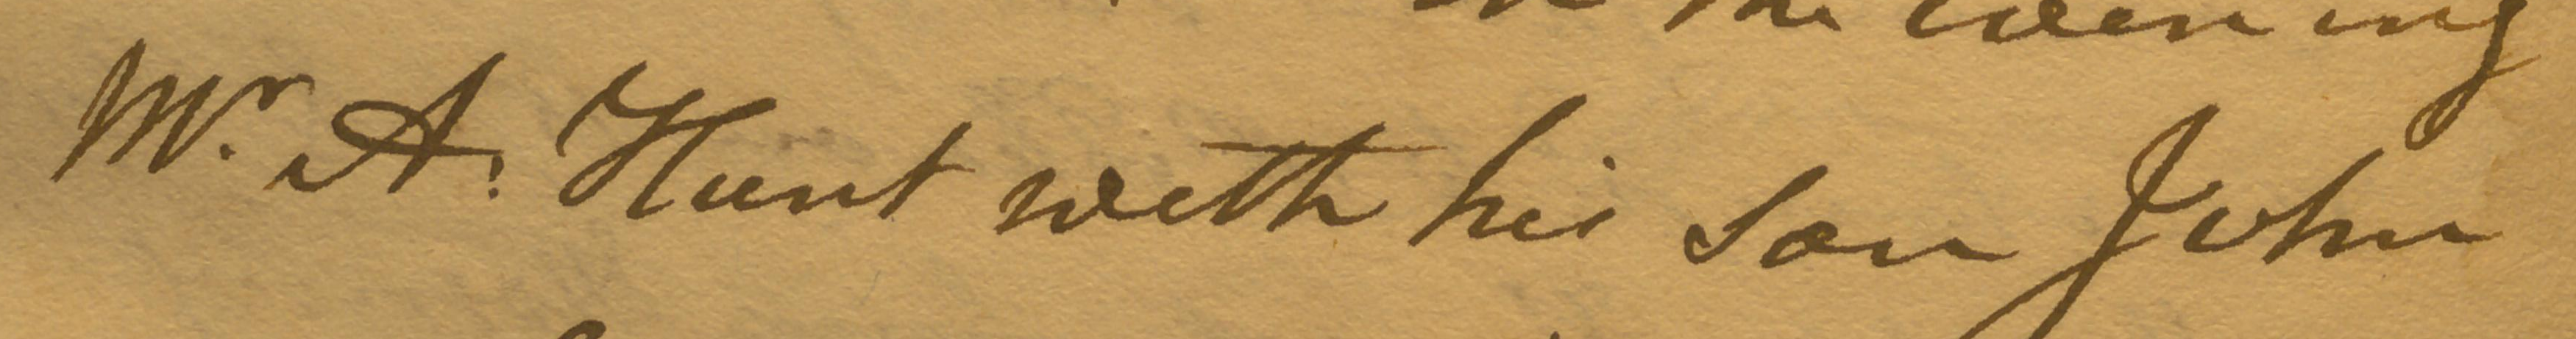M^r. A. Hunt with his son John
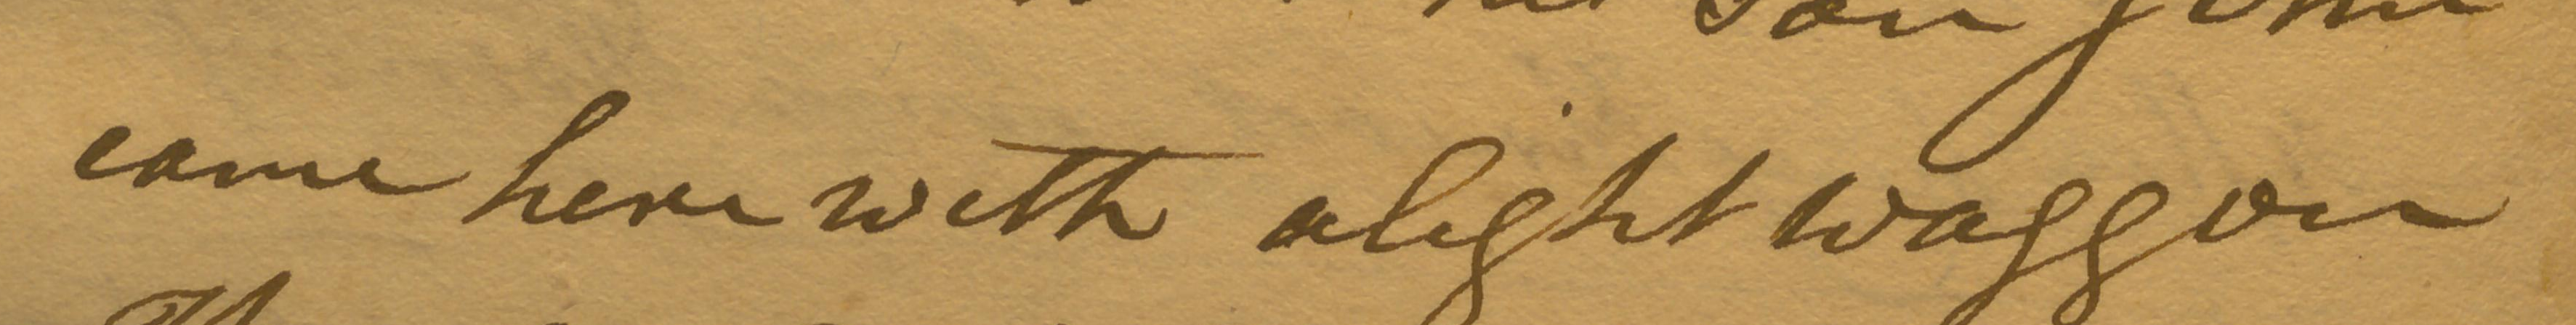came here with a light waggon
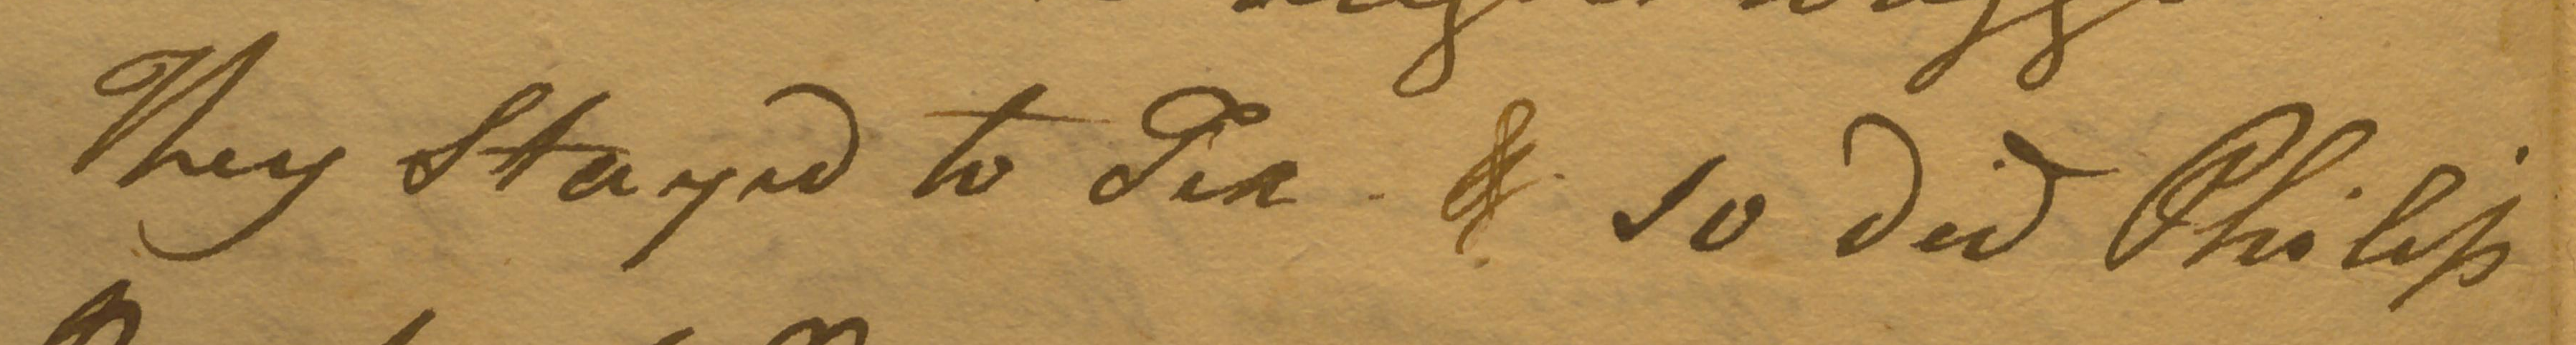They Stayed to Tea & so did Philip
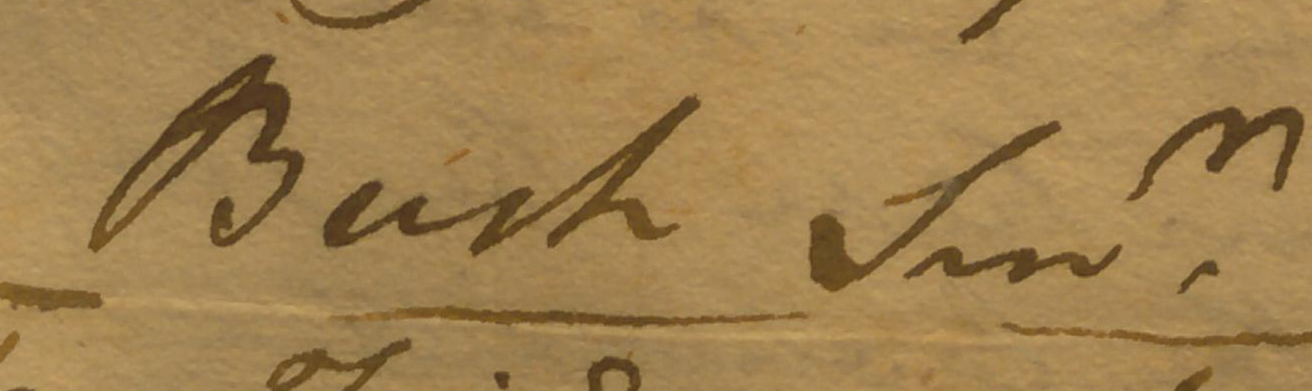Bush Sen^r.
